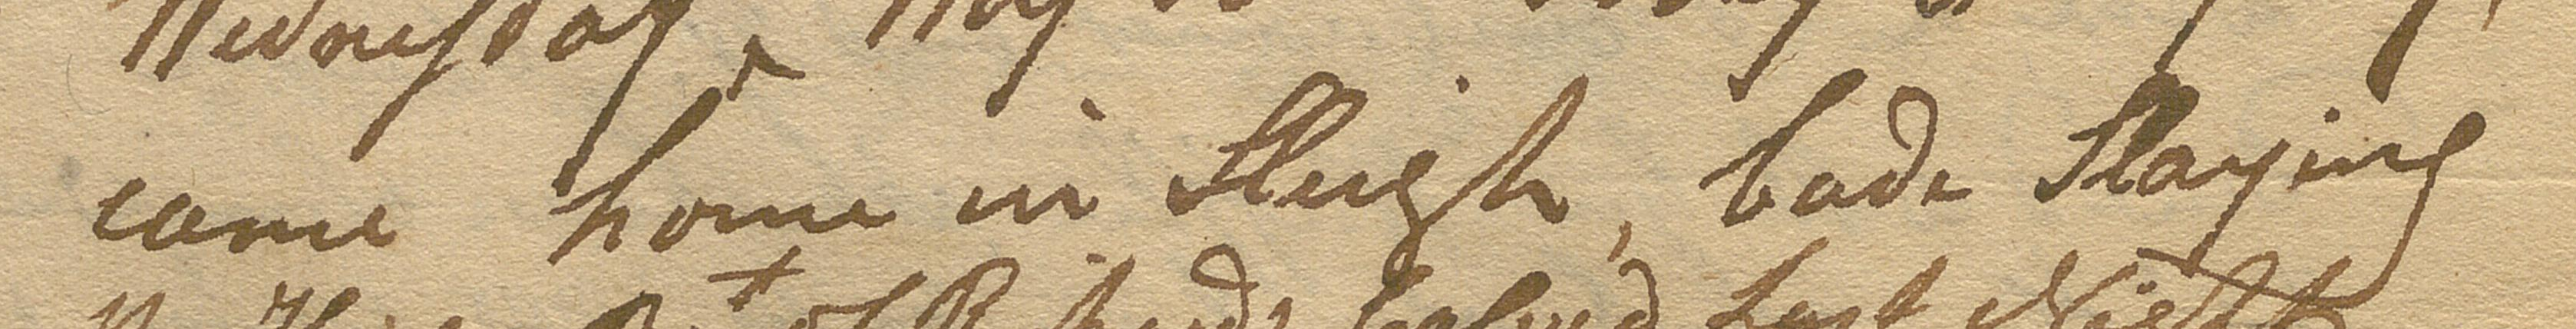came home in sleigh, bade slaying
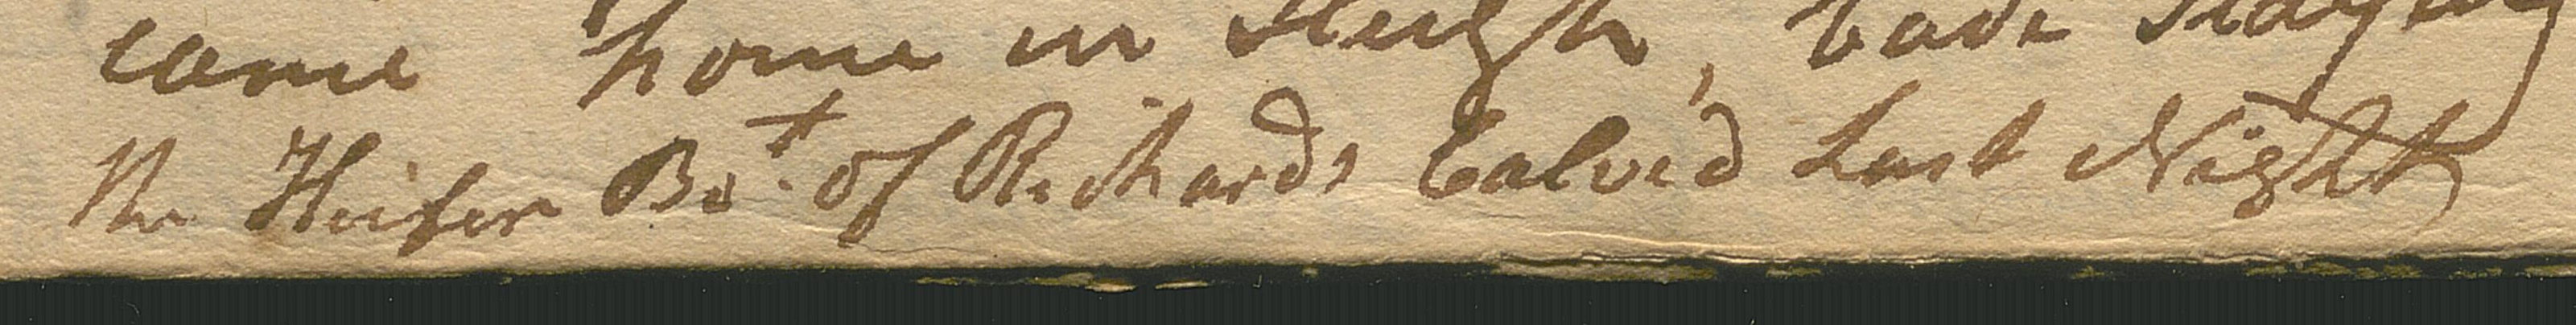the Heifer Bo^t. of Richards Calved Last Night
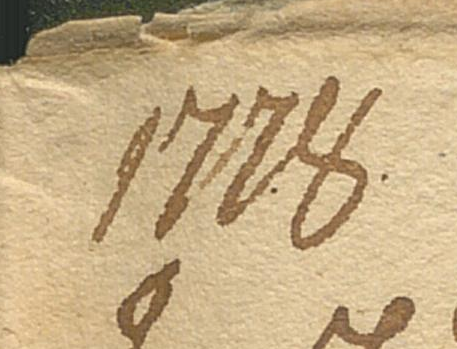1778
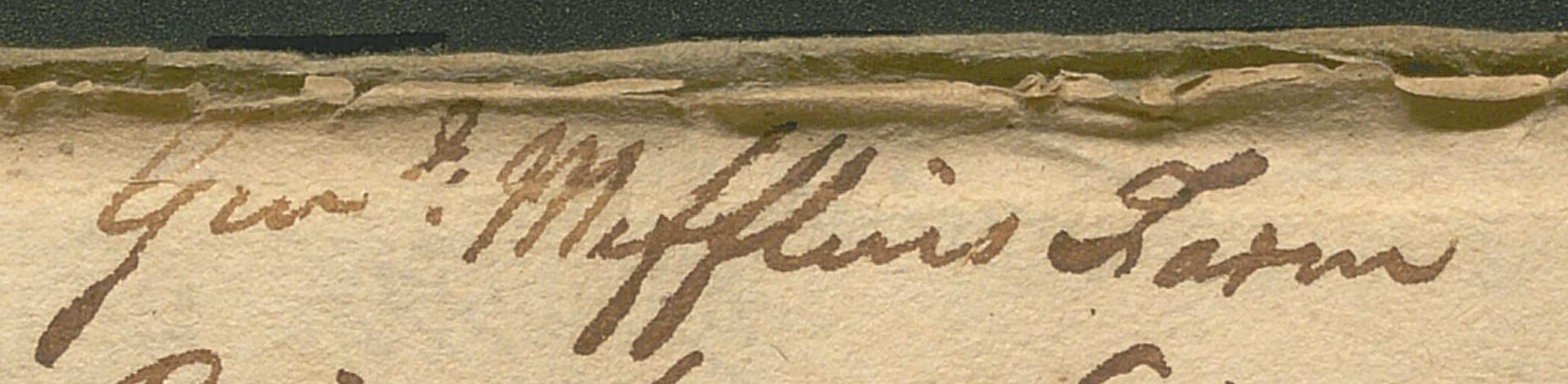Gen^l. Mifflins Farm
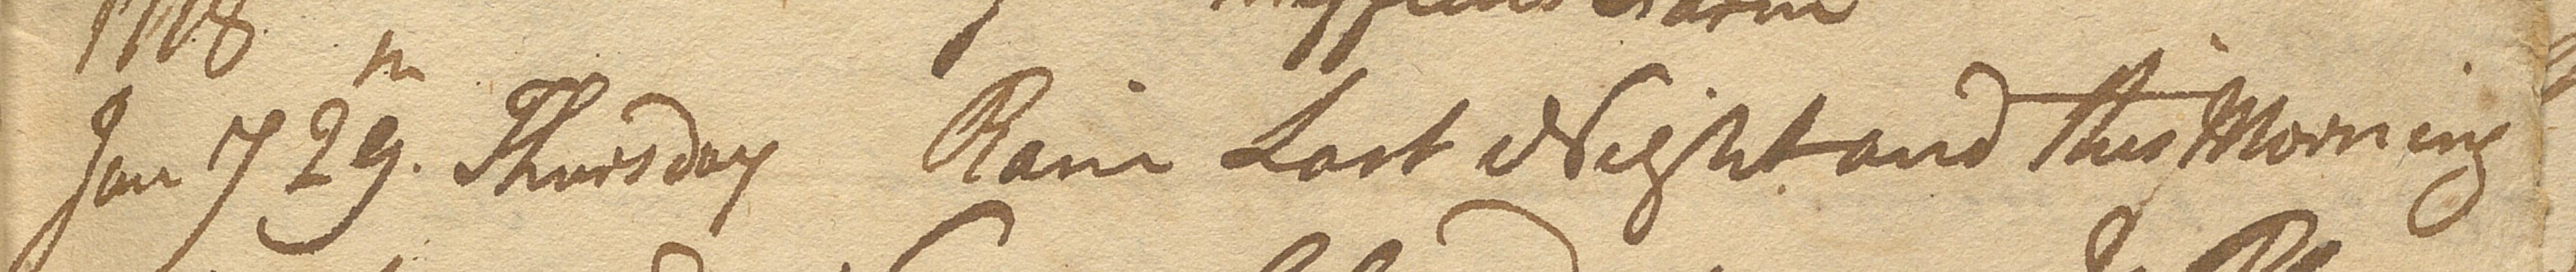Jan^y 7 29th. Thursday Rain Last Night and this Morning
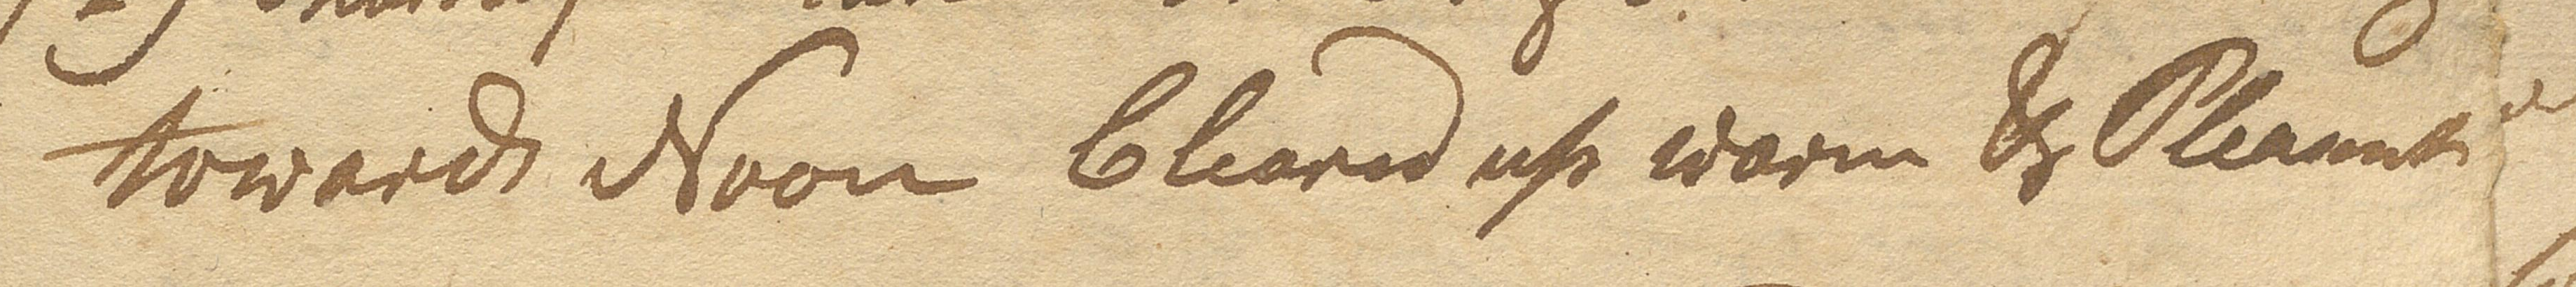towards Noon Cleared up warm & Pleasent,
